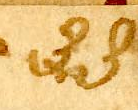33
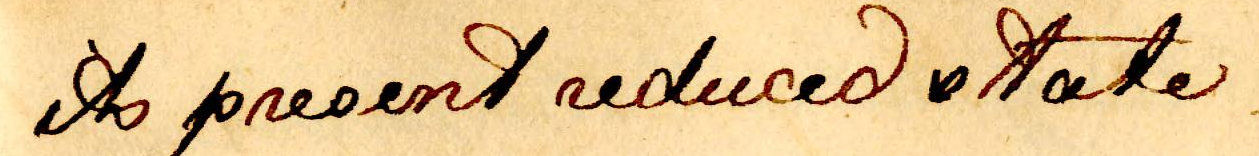its present reduced state
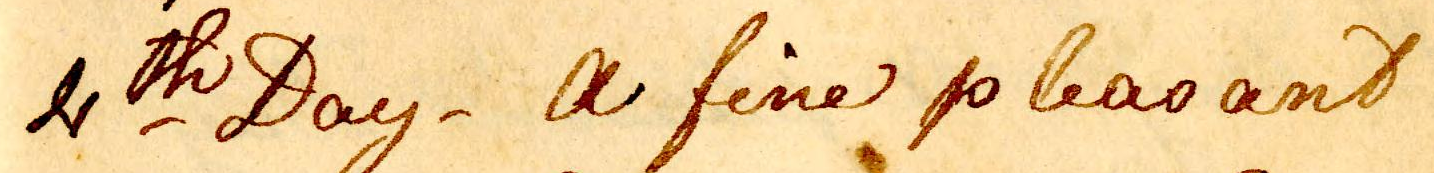4^th Day- A fine pleasant
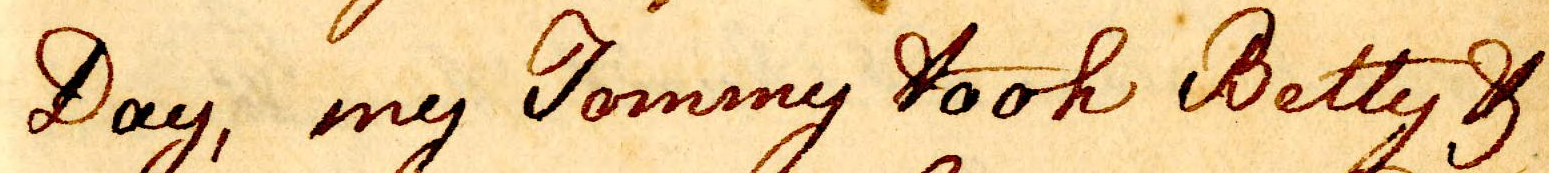Day, my Tommy took Betty &
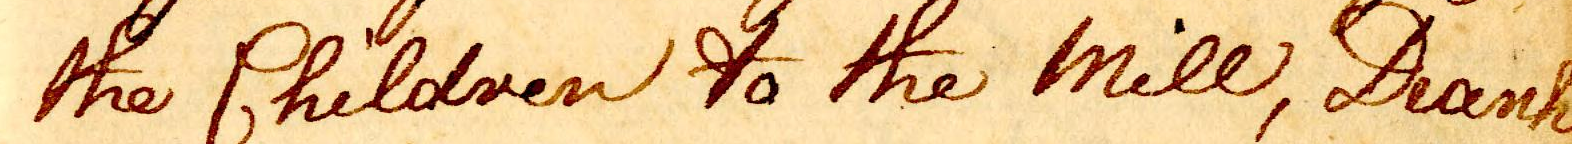the Children to the Mill, Drank
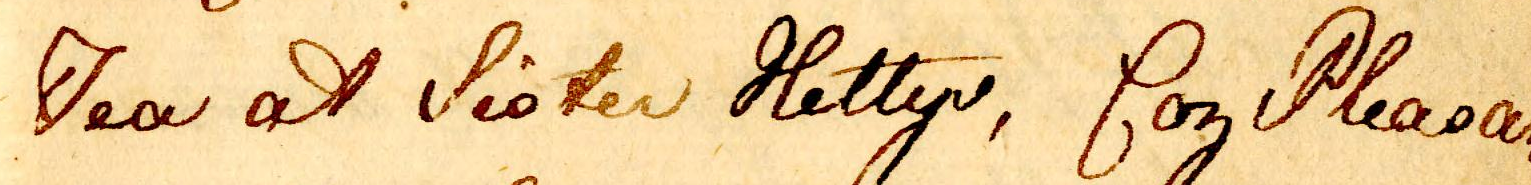Tea at Sister Hettys, Coz Pleasant
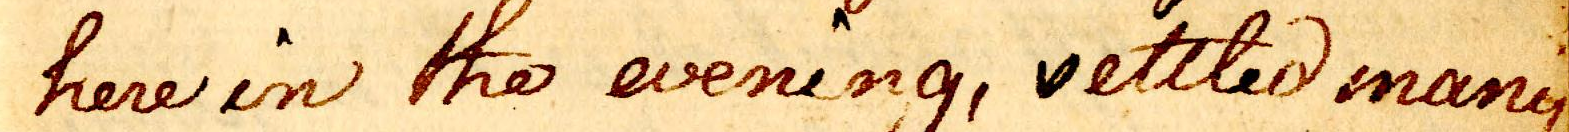here in the evening, settled many
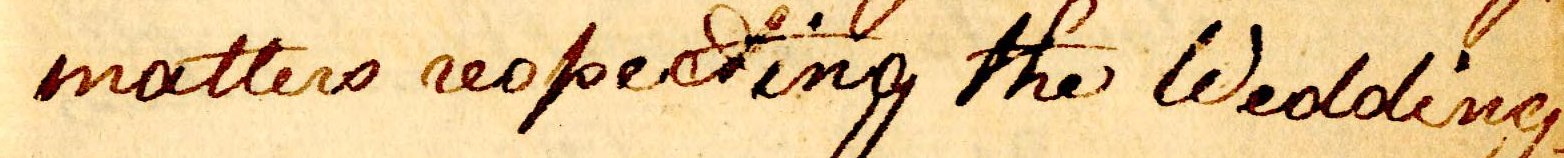matters respecting the Wedding
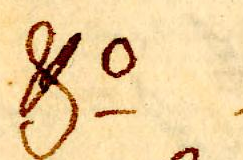&^o-
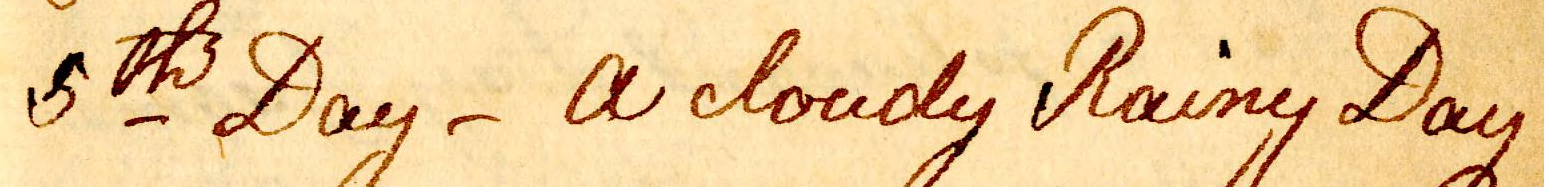5^th Day- A cloudy Rainy Day
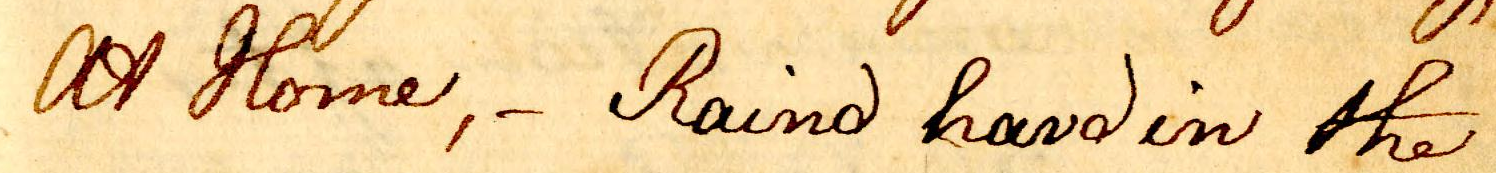At Home, - Raind hard in the
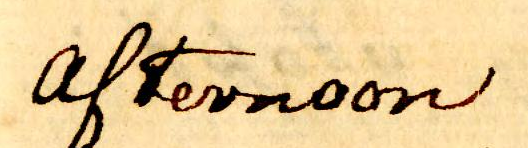Afternoon
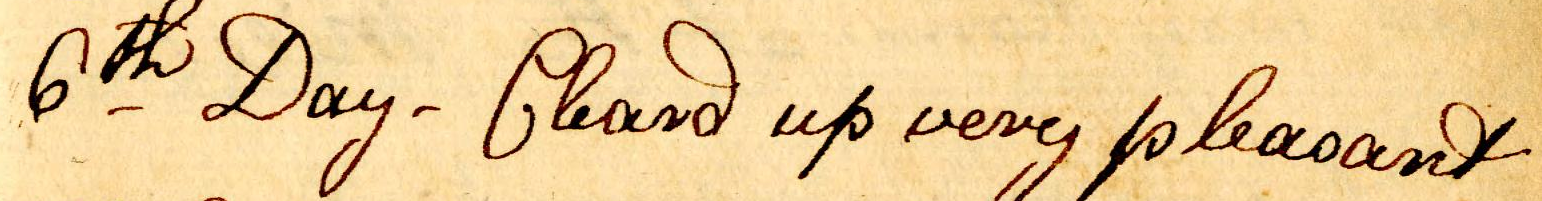6^th Day- Cleard up very pleasant
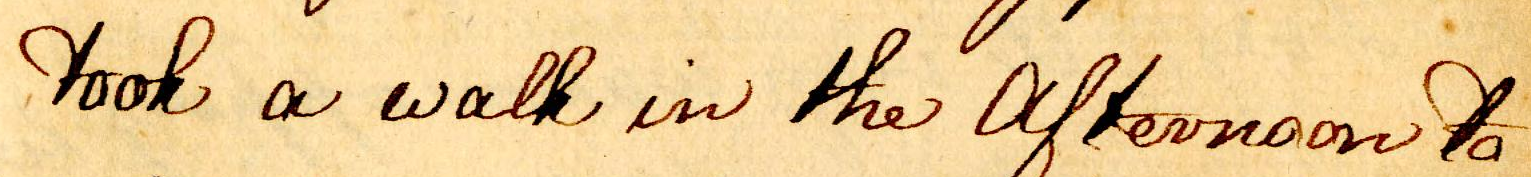took a walk in the Afternoon to
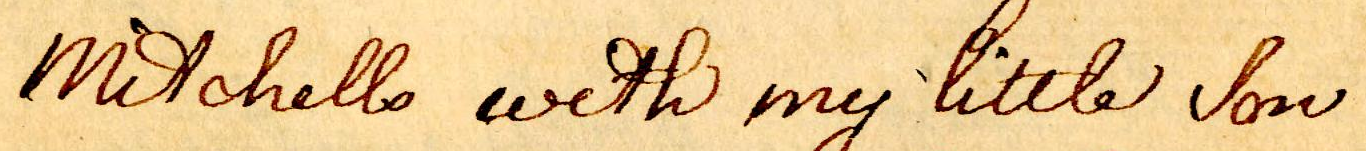Mitchells with my little Son
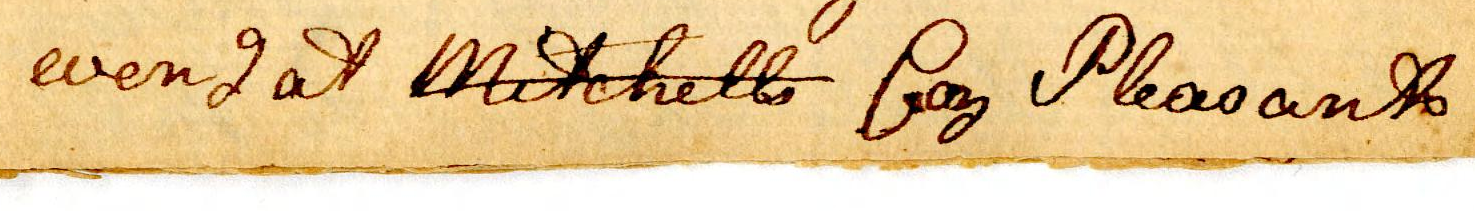even^g at [Mitchells] Coz Pleasants
